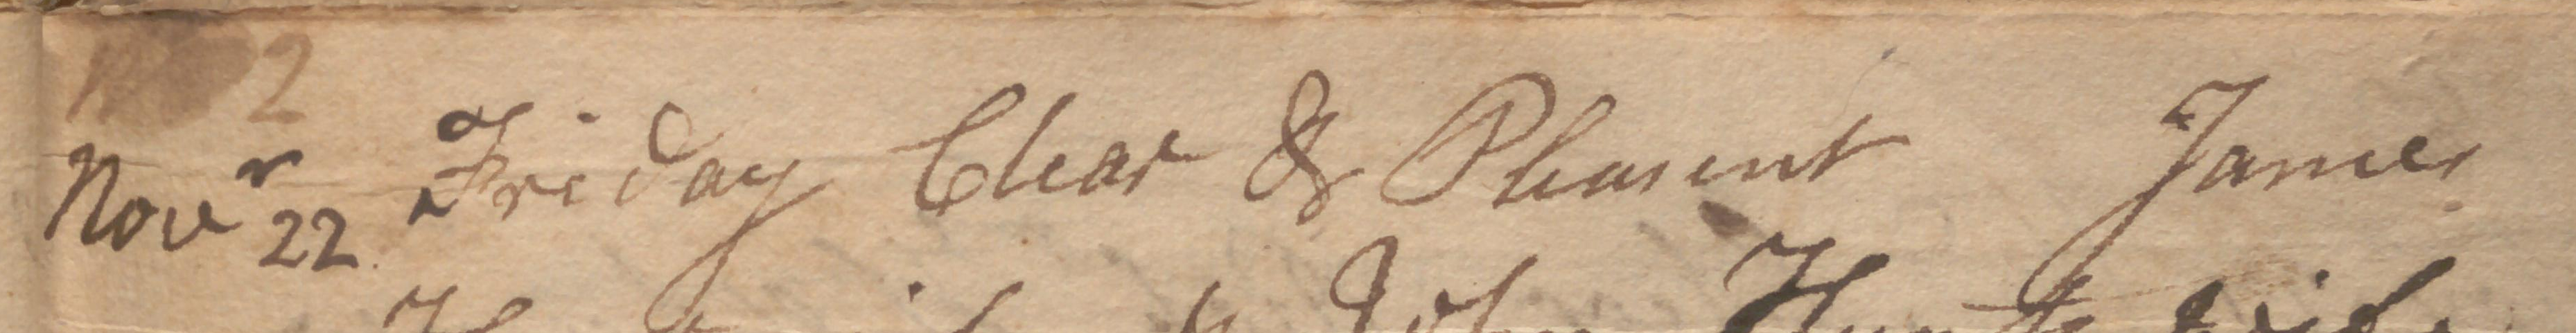Nov^r 22 Friday Clear & Pleasent James
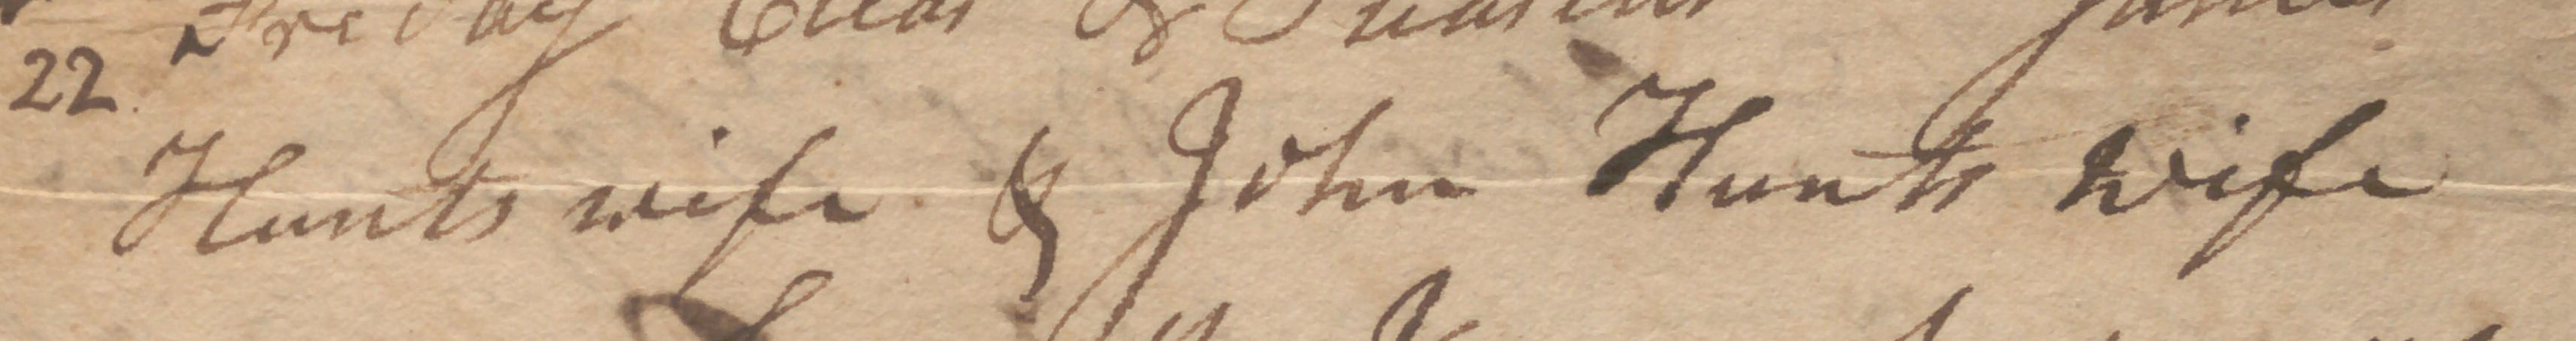Hunts wife & John Hunts wife
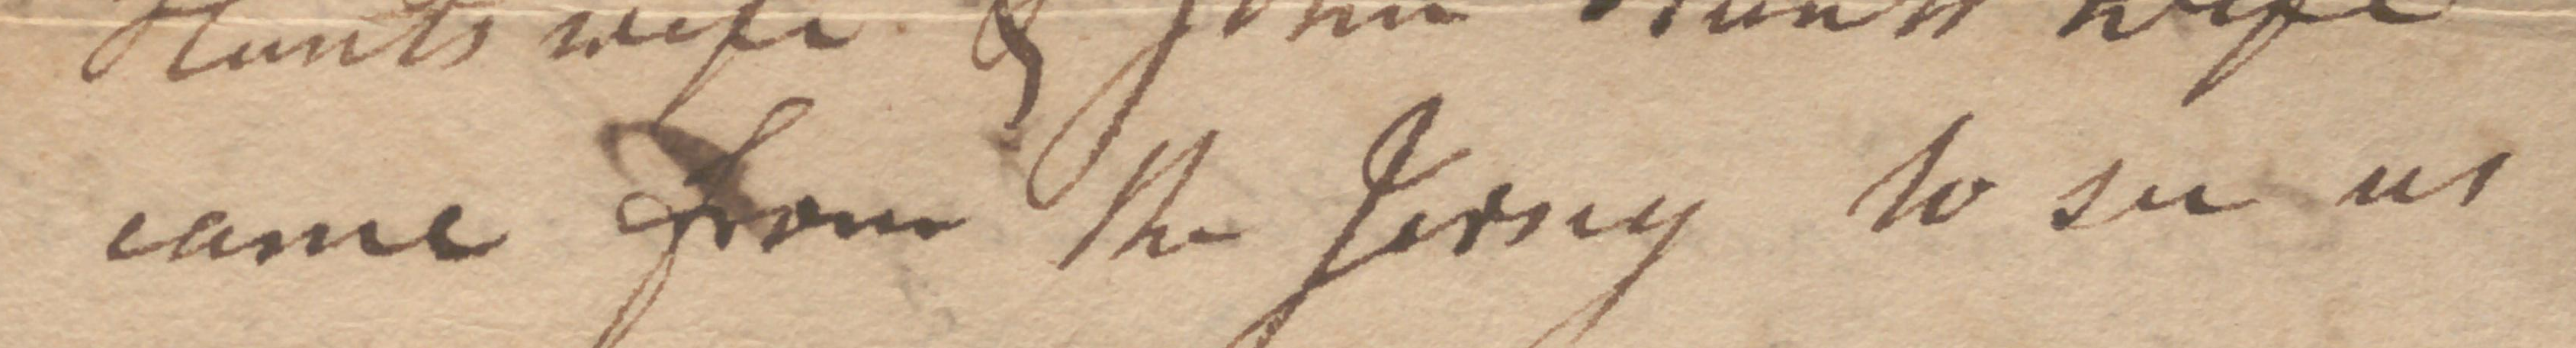came from the Jersey to see us
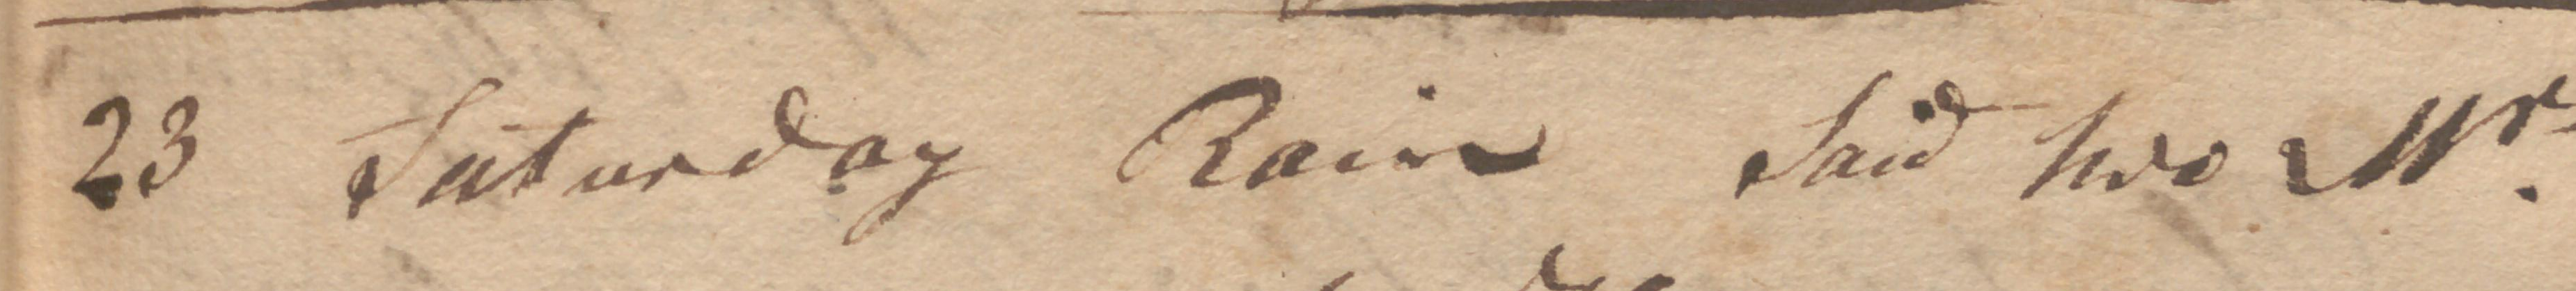23 Saturday Rain said two M^r.
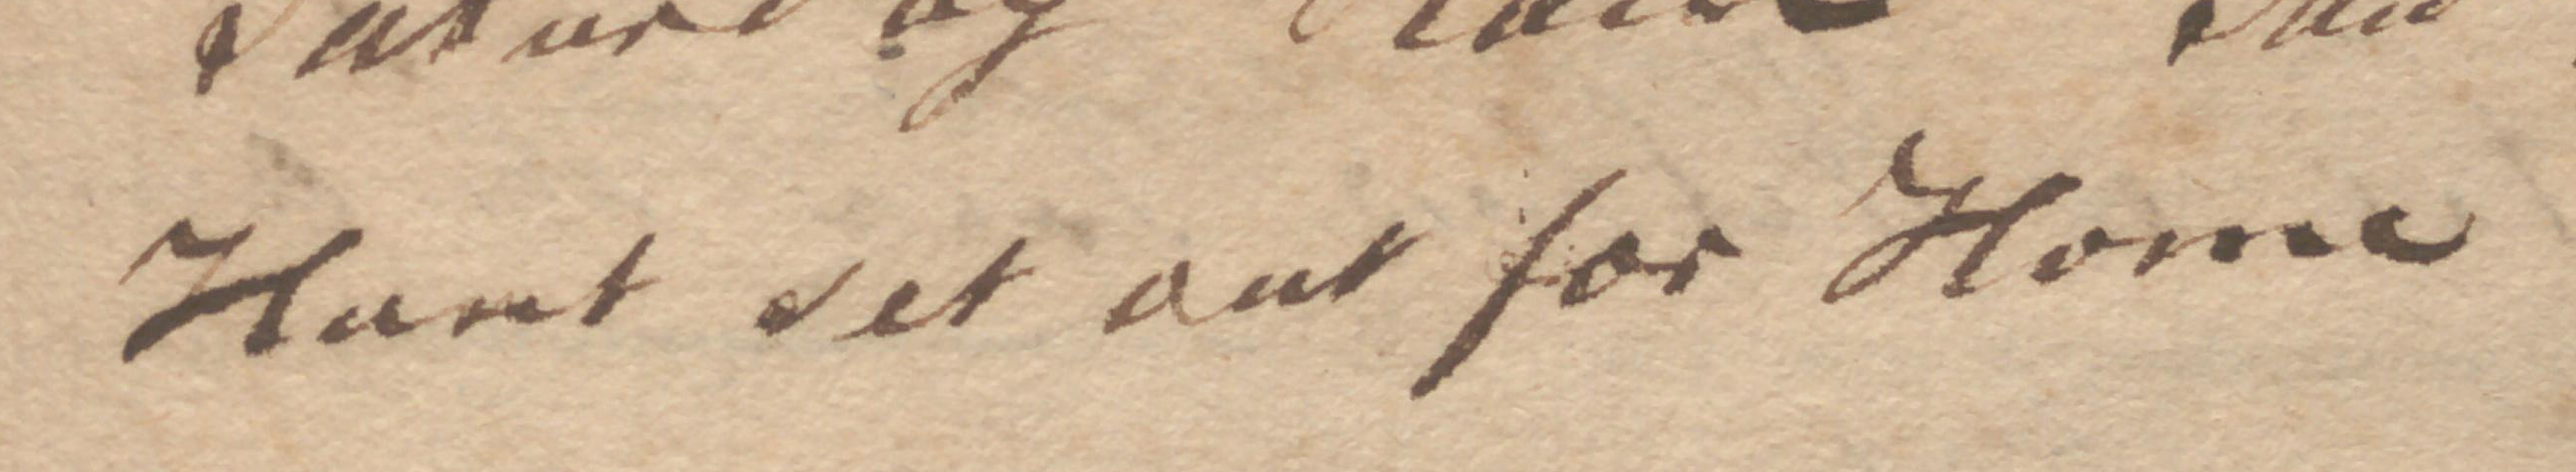Hunt set out for Home
